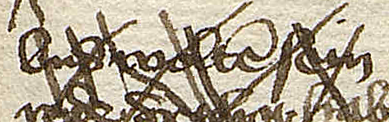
vnd wolte* ſein
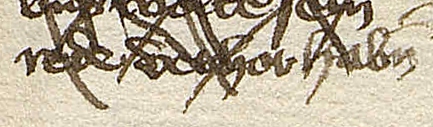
rede verhor habn*
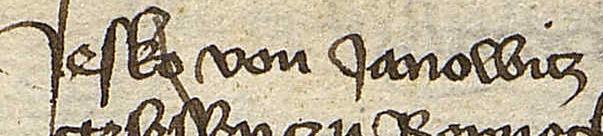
Ieſko von Ianowicʒ
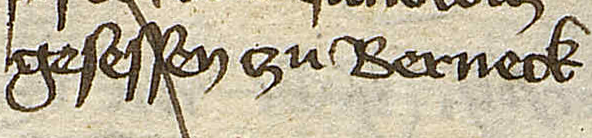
geſeſſen cʒu Berneck
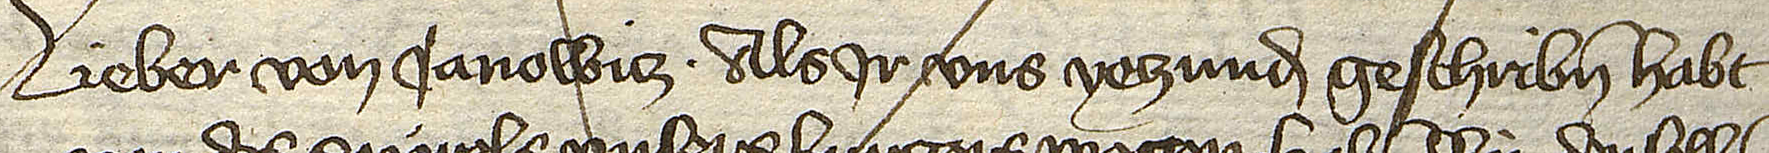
Lieber von Ianowicʒ . Als Ir vns yecʒund* geſchribn* habt
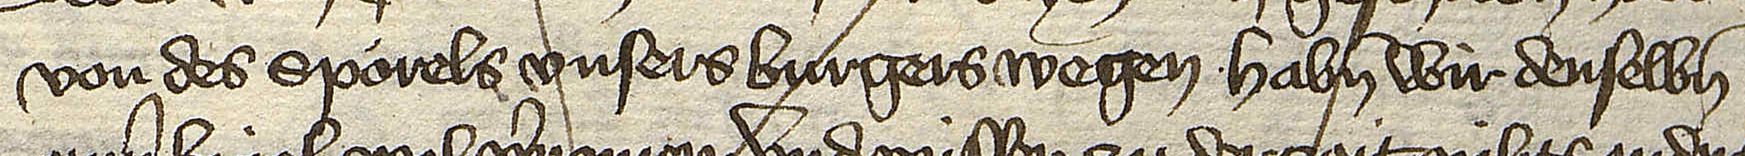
von des Spörels vnſers burgers wegen habn* wir denſelbn*
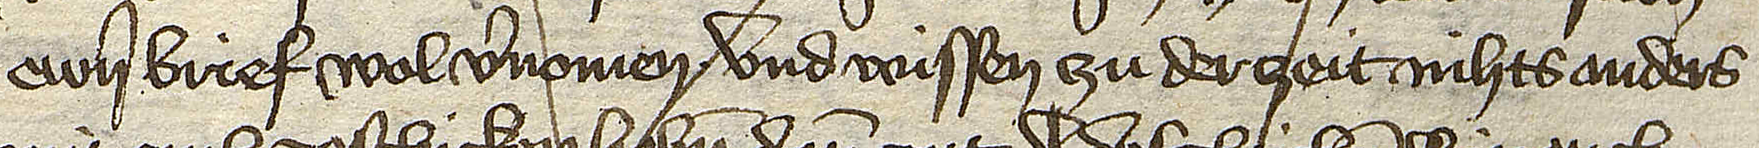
ewn* brief wol v*nomen . Vnd wiſſen cʒu der cʒeit nihts anders
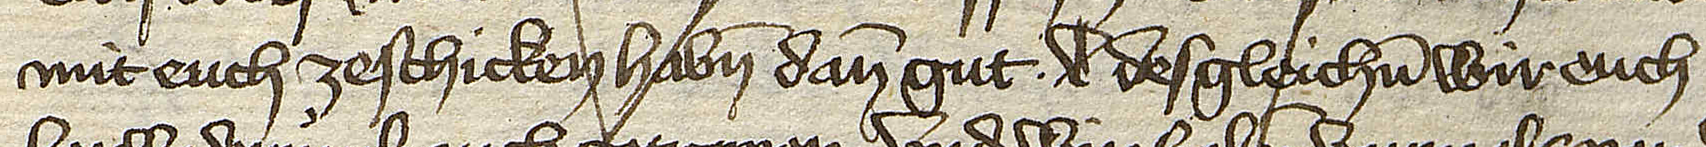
mit euch cʒeſchicken habn* dan* gut . % deſgleichn* wir euch
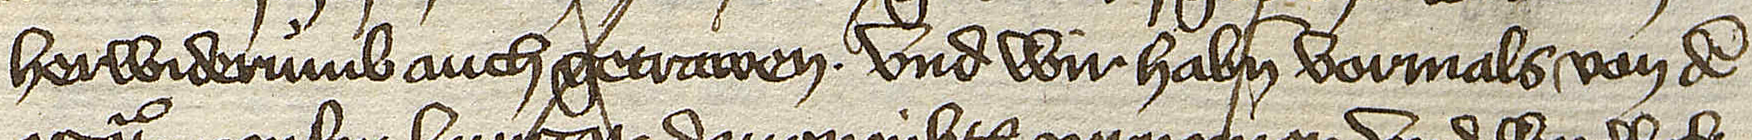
herwiderümb auch getrawen . Vnd wir habn* vormals von d*
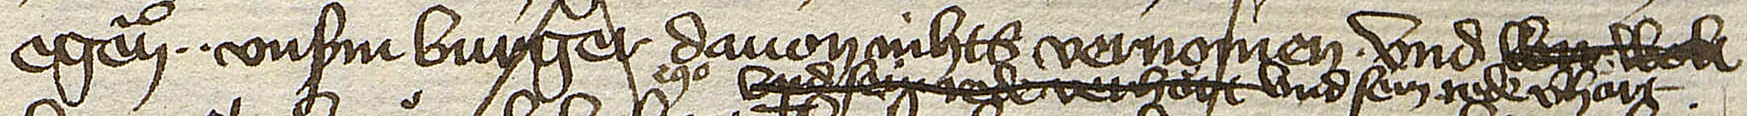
egen* ~ vnſ*m burger dauon nihts vernomen . Vnd wir woll
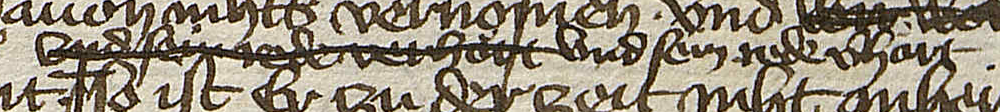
vnd ſein rede verhört vnd ſein rede v*hört
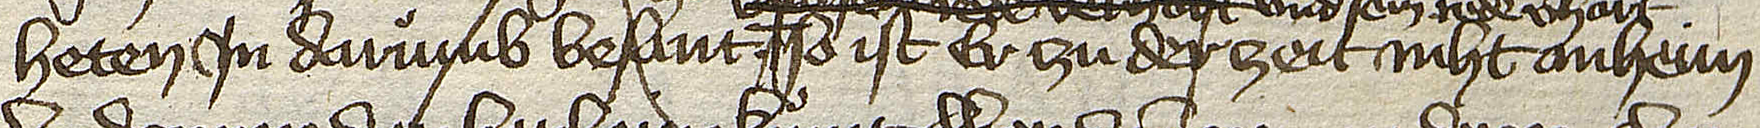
heten In darümb beſant . ſo iſt Er cʒu der cʒeit niht anheim
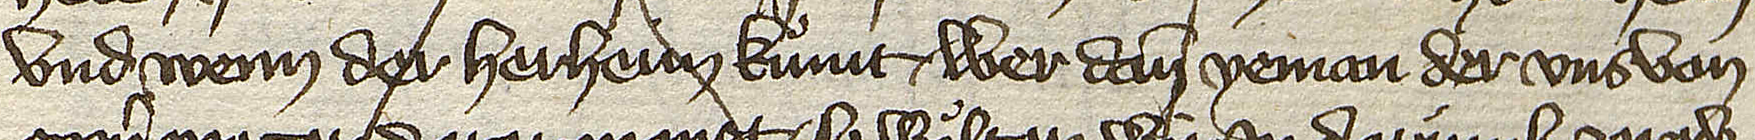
vnd wenn der herheim kümt / wer dan* yeman der vns von
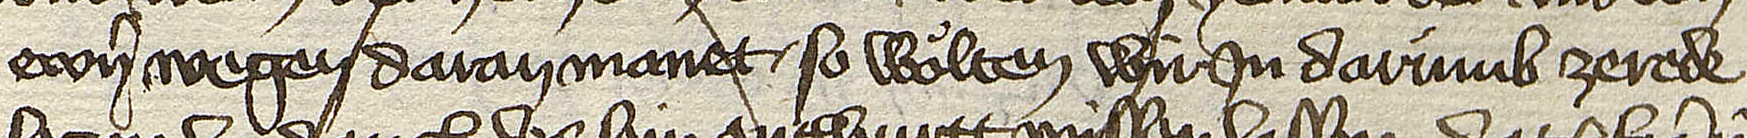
ewn* wegen daran manet / ſo wölten wir In darümb cʒerede
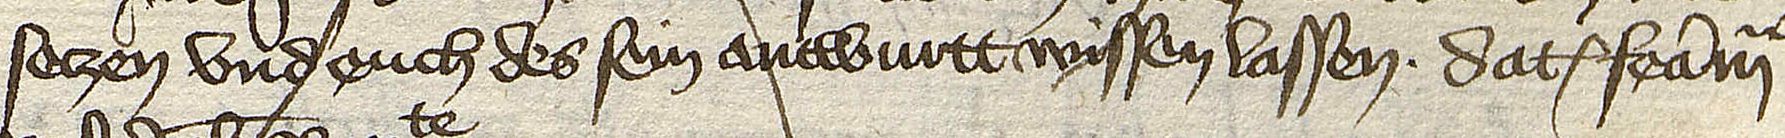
ſecʒen vnd euch des ſein antwurtt wiſſen laſſen . Dat* fea* iii*
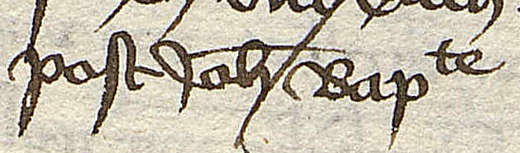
poſt Ioh* Bap*
